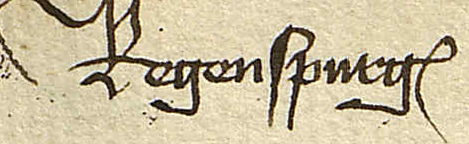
Regenſpurg*
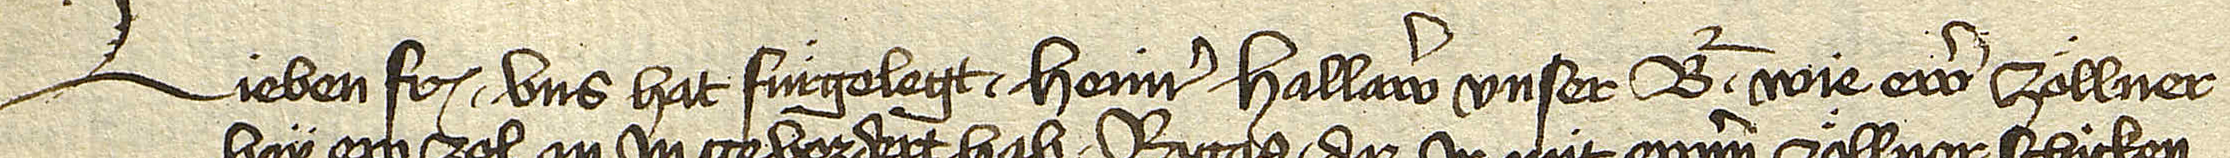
Lieben fr* / Vns hat fürgelegt / heinr* hallaw* vnſer B* / wie ew* Ʒöllner
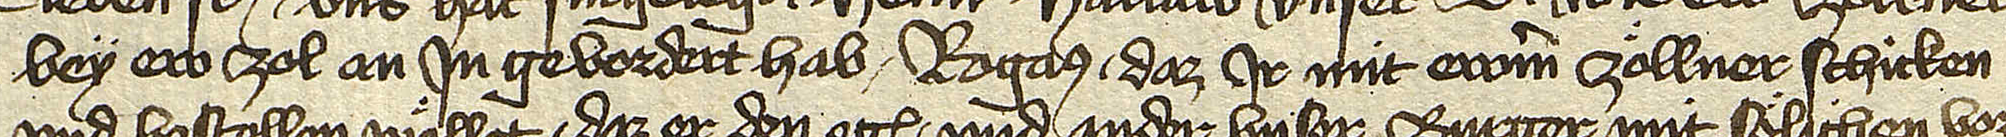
bey ew cʒol an In gevordert hab / Roga* / daʒ Ir mit ewm* cʒöllner ſchicken
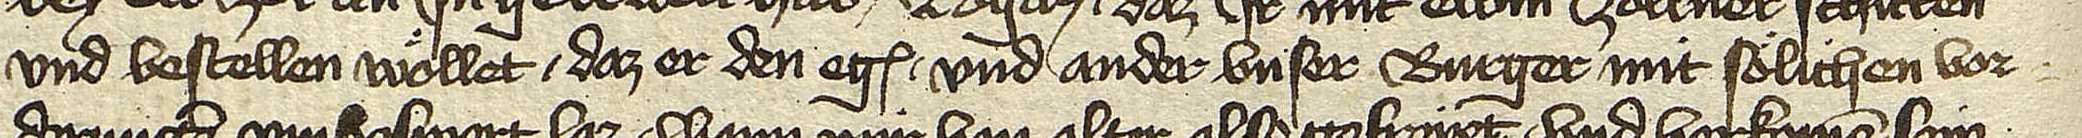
vnd beſtellen wöllet / daʒ er den eg* / vnd ander vnſer Burger mit ſölichen vor =
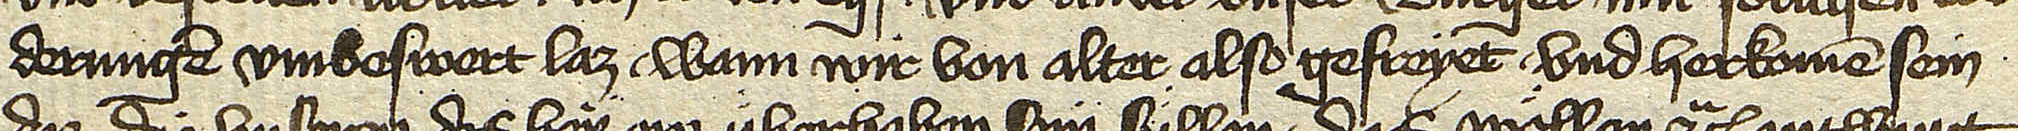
derunge* vmbeſwert laʒ / wann wir von alter alſo gefreyet / vnd herkome* ſein
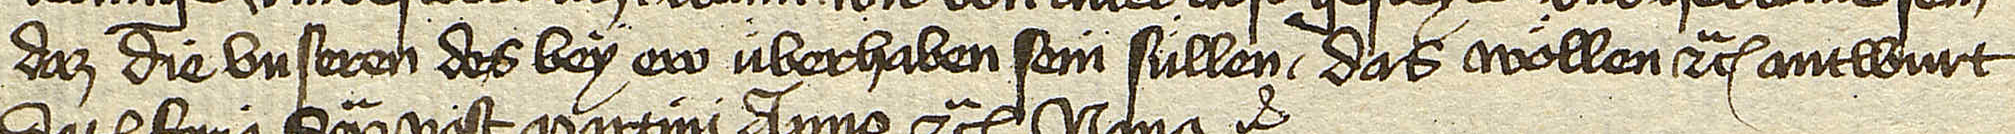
daʒ die vnſeren des bey ew überhaben ſein ſüllen / das wöllen ec* antwurt
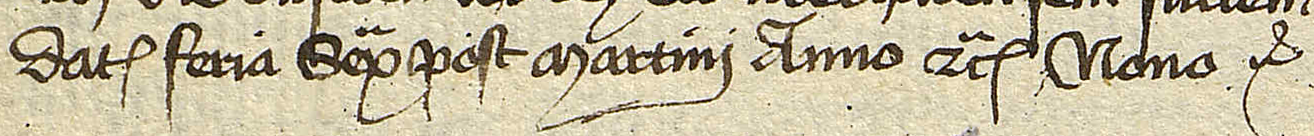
Dat* feria Sex* poſt Martini Anno ec* Nono §
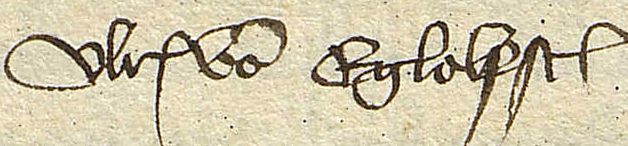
Vlr* vo* Eglofſt*
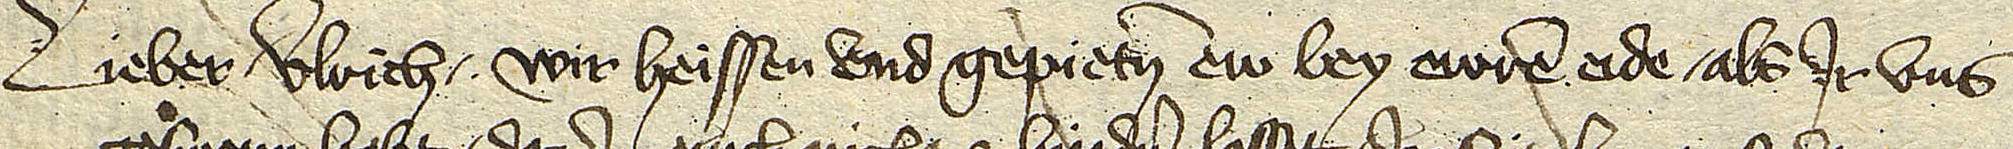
Lieber / Vlrich / . wir heiſſen vnd gepietn* ew bey ewre* eide / als Ir vns
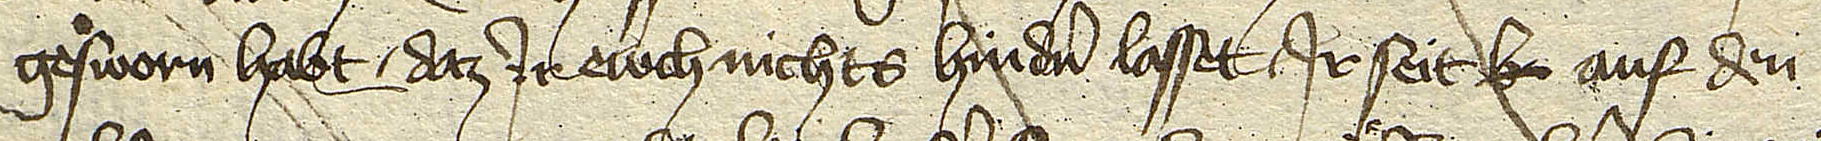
geſworn habt / daʒ Ir ewch nichts hindn* laſſet / Ir ſeit b auf den
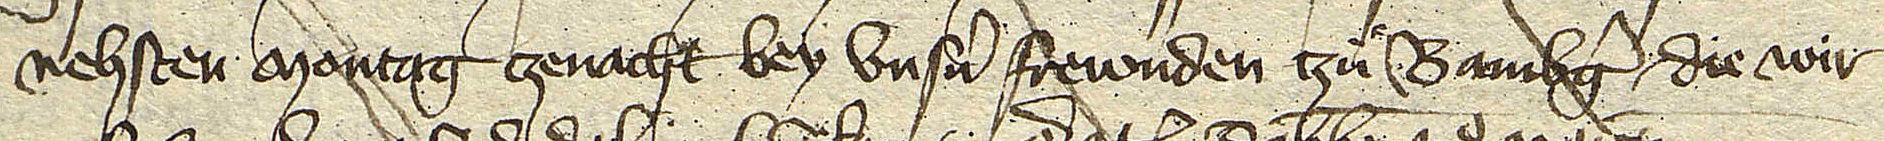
nehſten Montag cʒenacht bey vnſn* frewnden cʒü Bambg* / die wir
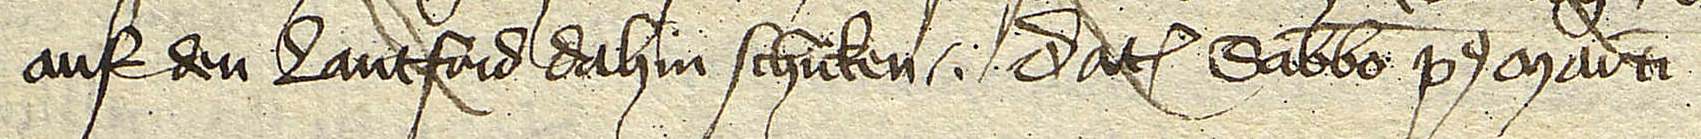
auf den Lantfrid dahin ſchicken / . Dat* Sabbo* p* Marti*
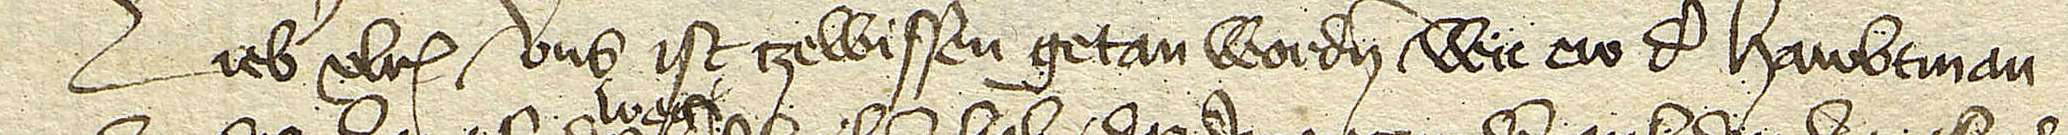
Lieb* vlr* / Vns iſt cʒewiſſen getan wordn* / wie ew d* hawbtman
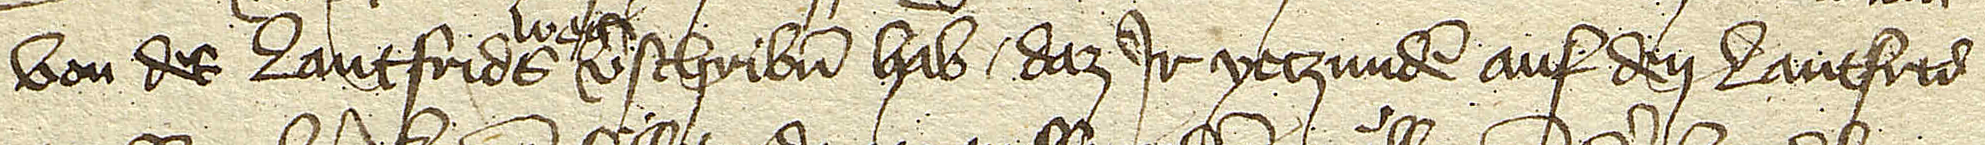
von des Lantfrids v*ſchribn* hab / daʒ Ir yecʒund* auf den Lantfrid
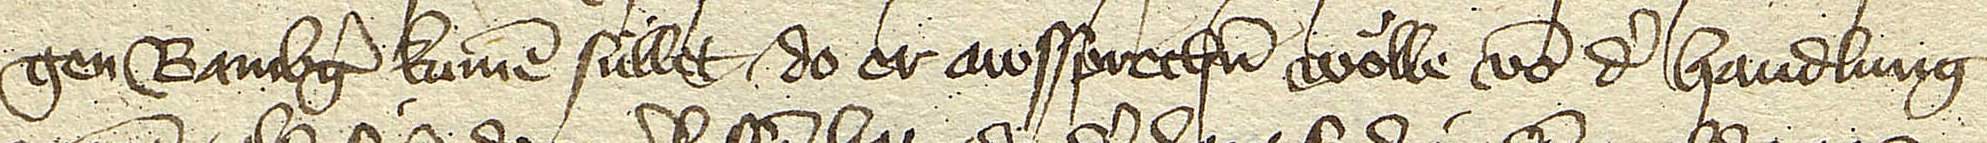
gen Bambg* kume* ſüllet / do er awſſprechn* wölle vo* d* handlung
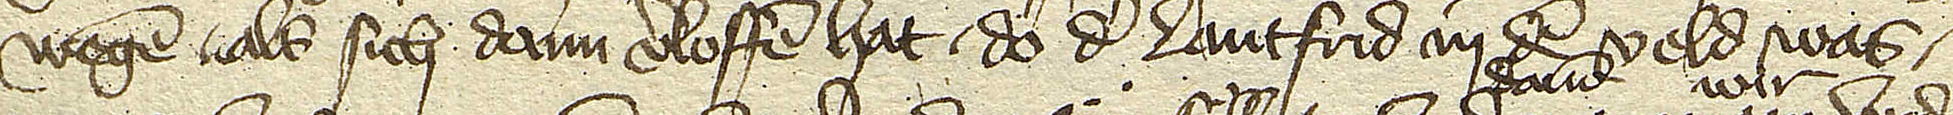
wege* / als ſich dann v*loffe* hat / do d* Lantfrid in d* veld was /
